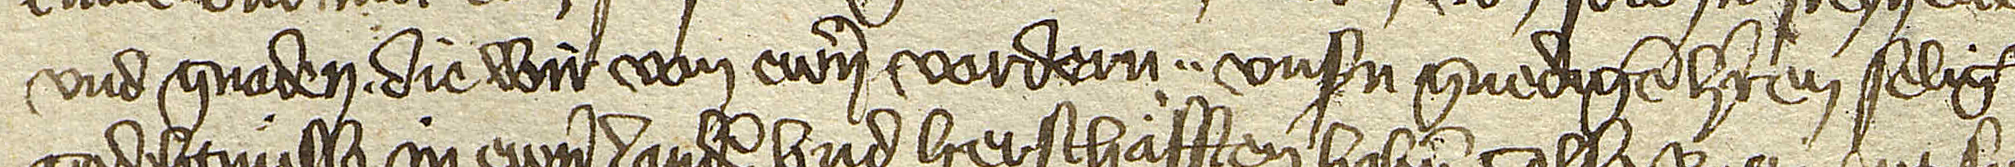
vnd gnaden / die wir von ewn* vordern ~ vnſ*n gnedige* h*ren ſelig*
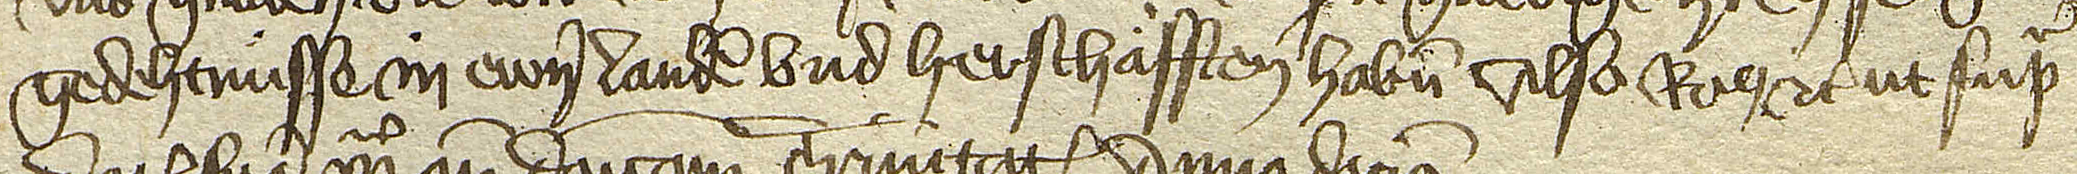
gedehtnüſſe in ewn* lande vnd herſchäfften habn* Alſo Ro* ec* ut ſup*
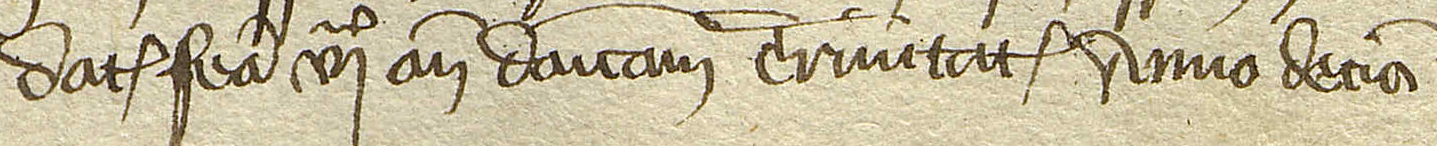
Dat* fea* vi* an* doicam* Trinitat* Anno decio*
